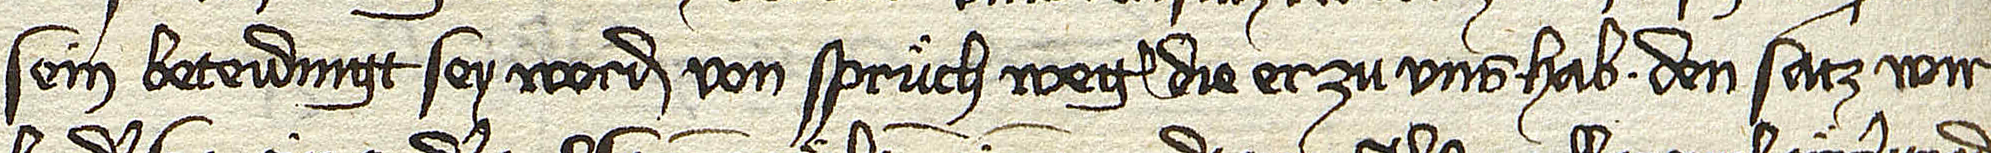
ſein beteidingt ſey word* von ſprüch weg* die er ʒu vns hab . den ſacʒ wir
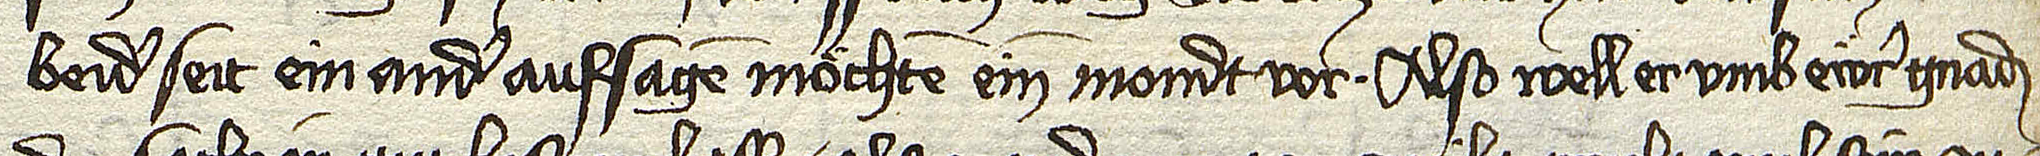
beid*ſeit ein and* aufſage* möchte* ein* mondt vor . Alſo well er vmb ewr* gnad*
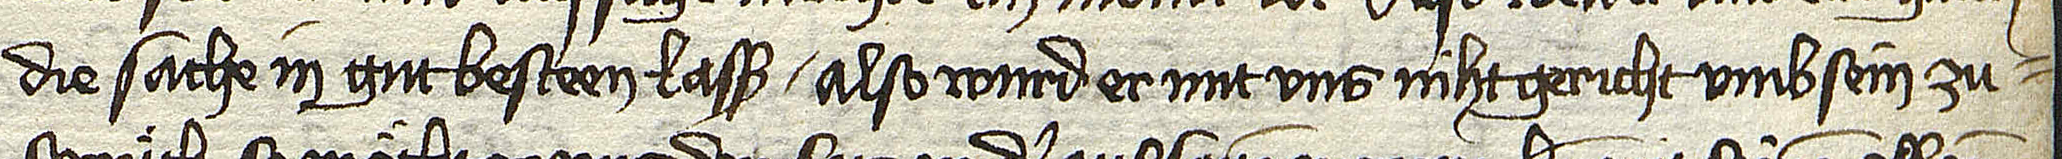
die ſache in gut beſteen laſſ* / Alſo wurd er mit vns niht gericht vmb ſein ʒu =
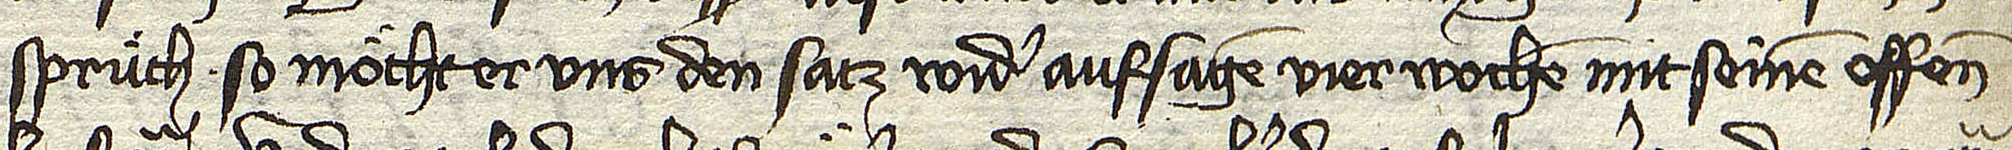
ſprüch . ſo möcht er vns den ſacʒ wid* aufſage* vier woche* mit ſeine* offen*
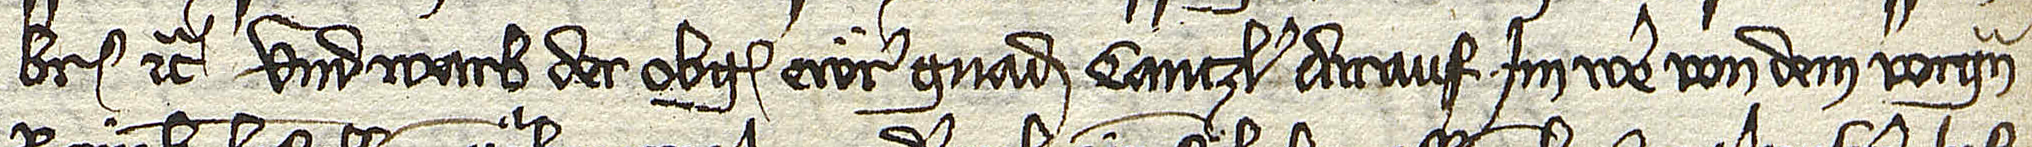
br* ec* Vnd warb der obg* ewr* gnad* Cancʒl* darauf . Im we* von dem vorg*n
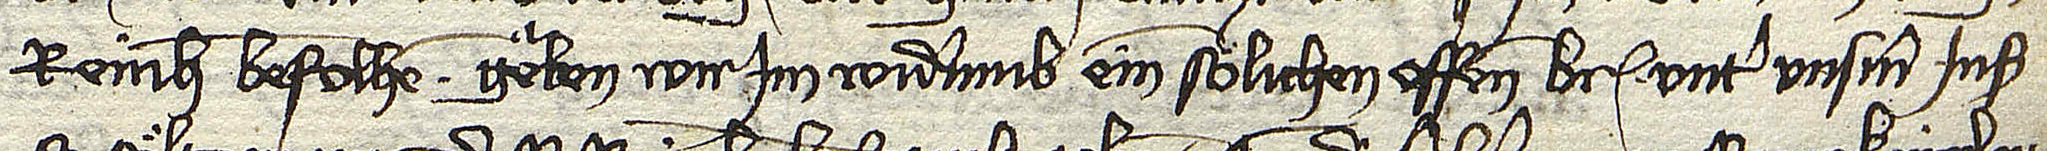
Reinh* befolhe* . gëben wir Im wid*umb ein* ſölichen offen* br* . vnt* vnſ*m Inſ*
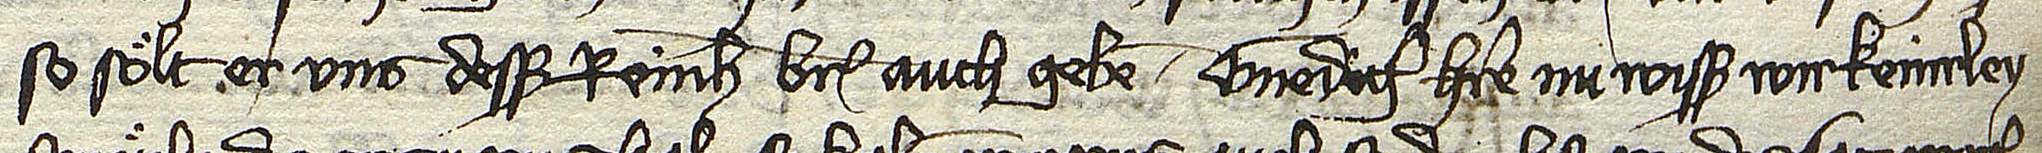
ſo ſölt er vns deſſ* Reinh* br* auch gebe* / Gnedig* h*re nu wiſſ* wir keinrley
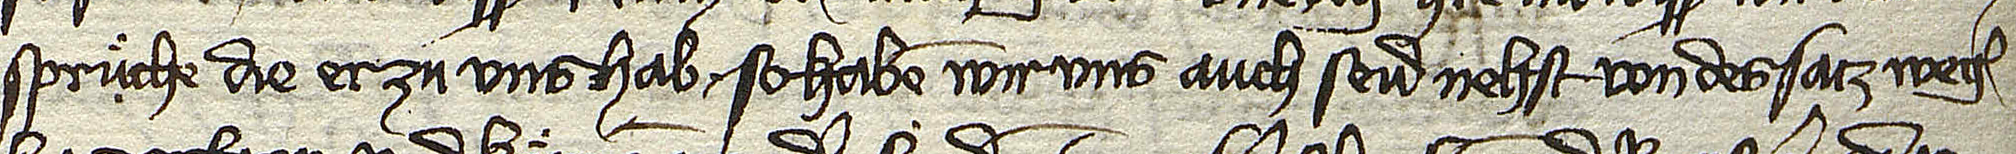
ſprüche die er ʒu vns hab . ſo habe* wir vns auch ſeid nehſt von des ſacʒ weg*
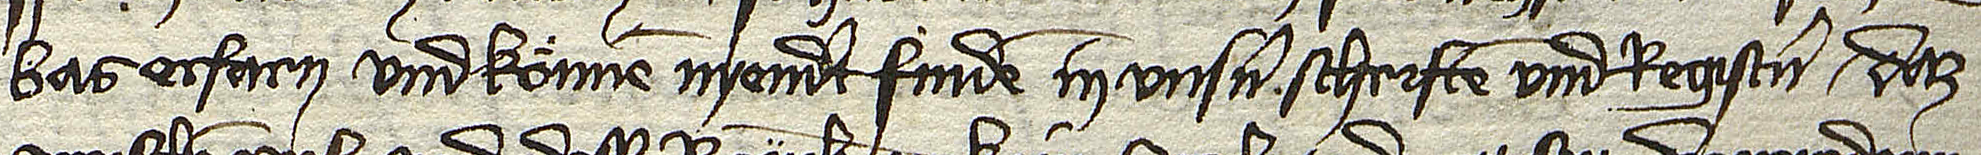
bas erfarn vnd könne* nyend*t finde* in vnſ*n . ſchrifte* vnd Regiſt*n / Daʒ
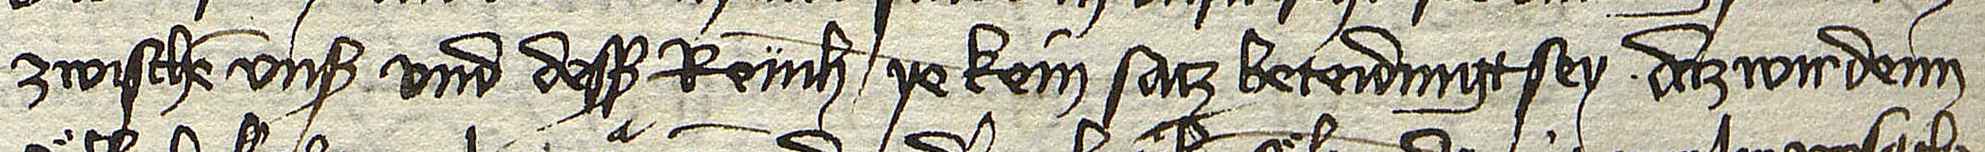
ʒwiſche* vnſ* vnd deſſ* Reinh* ye kein ſacʒ beteidingt ſey . Daʒ wir denn
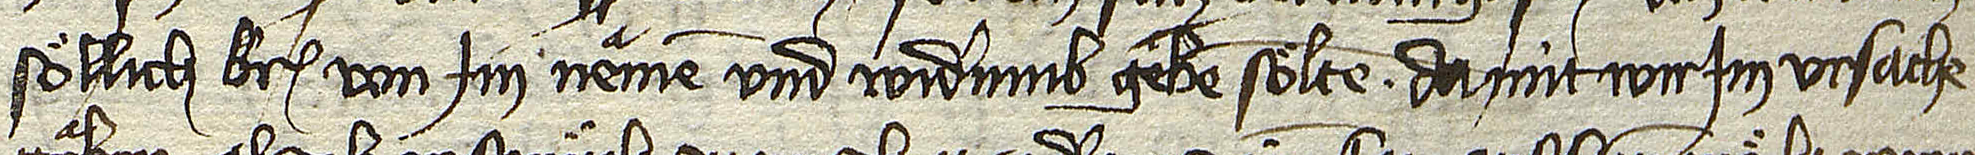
ſöllich br* von Im nëme* vnd wid*umb gebe* ſölte* . damit wir Im vrſache
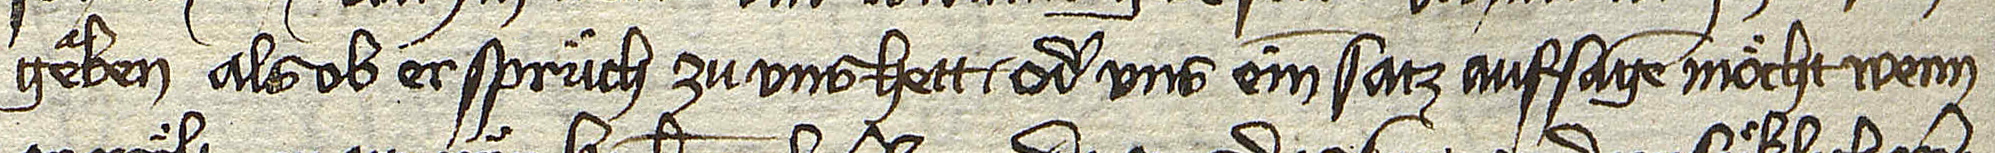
gëben als ob er ſprüch ʒu vns hett / od* vns ein* ſacʒ aufſage* möcht wenn
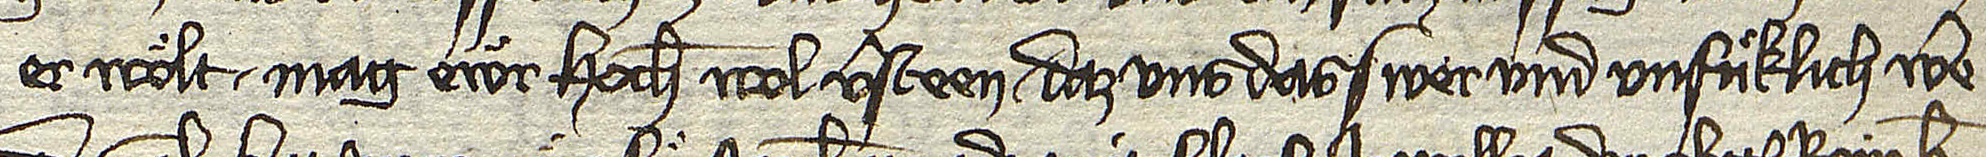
er wölt / mag ewr Hoch* wol v*ſteen / daʒvns das ſwer vnd vnfüklich we*
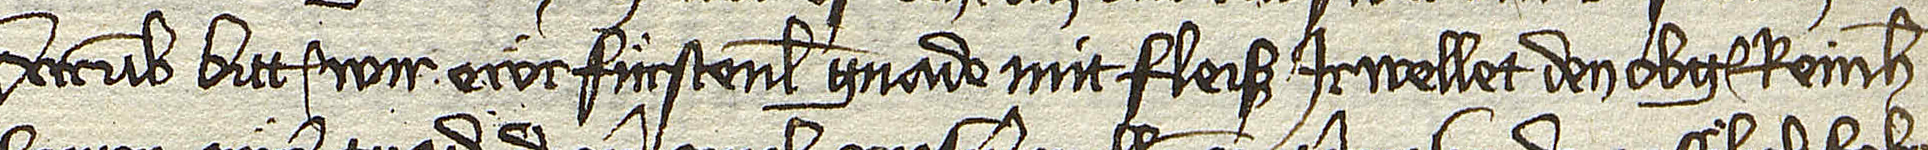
Daru*b bitt* wir ewr fürſtenl* gnade mit fleiſʒ Ir wellet den obg* Reinh*
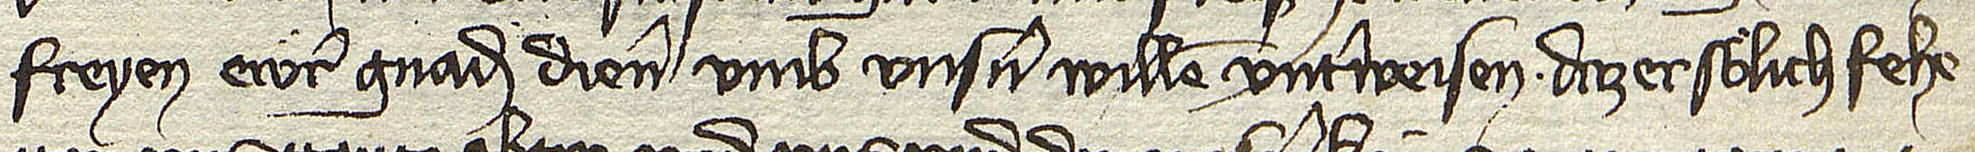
freyen ewr* gnad* dien* vmb vnſ*n wille* vnt*weiſen . daʒ er ſölich fehe
